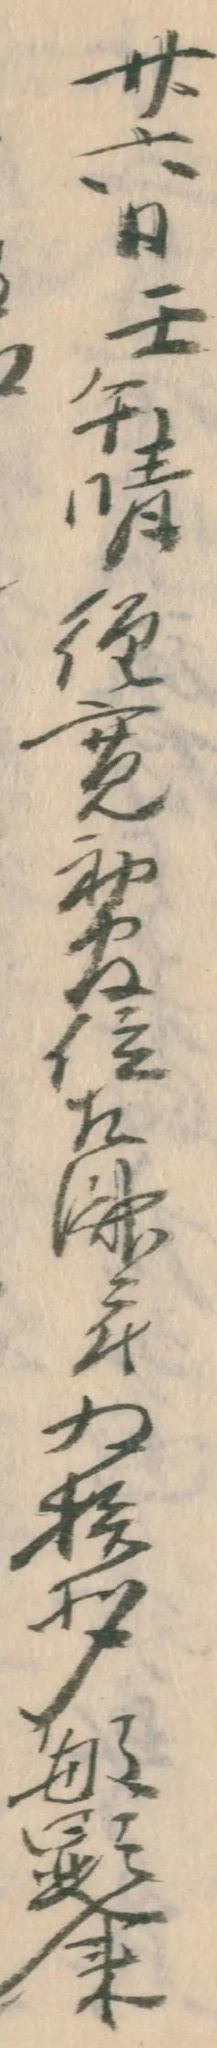廿六日壬午晴経寛初官位相済ニ付為挨拶敏顕入来
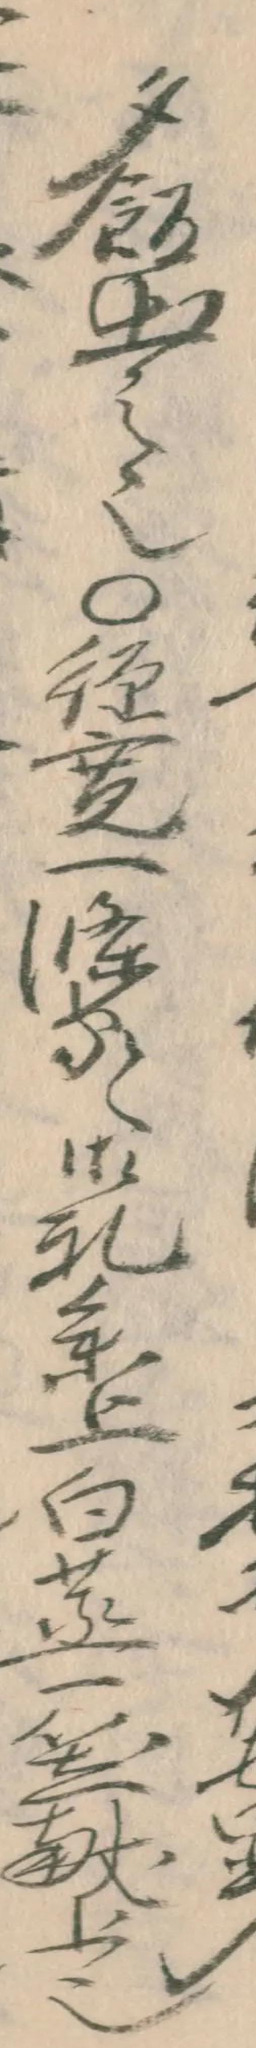タ飯出之也○経寛一條家へ御礼参上白蒸一器献上也
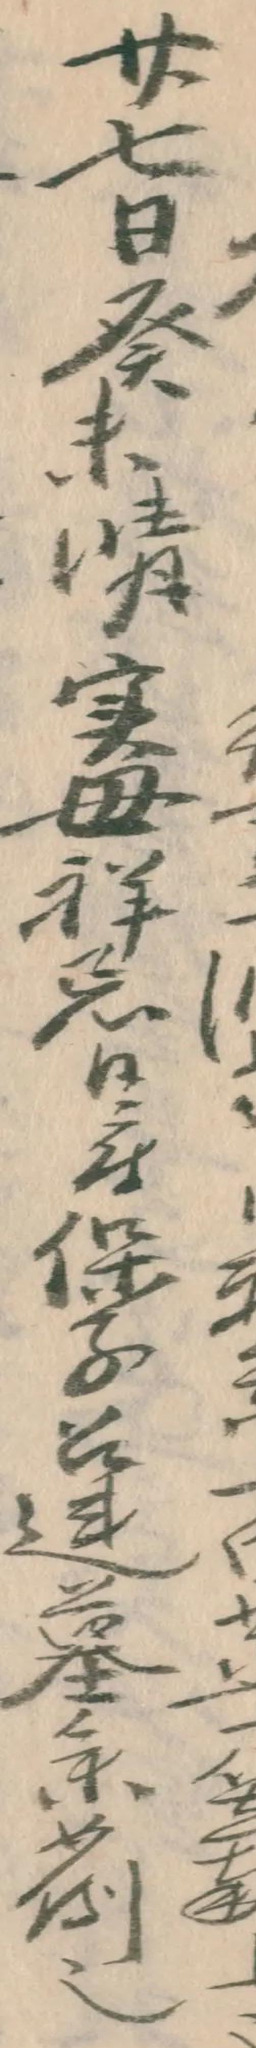廿七日癸未晴実母祥忌日に付保子召連墓参如例也
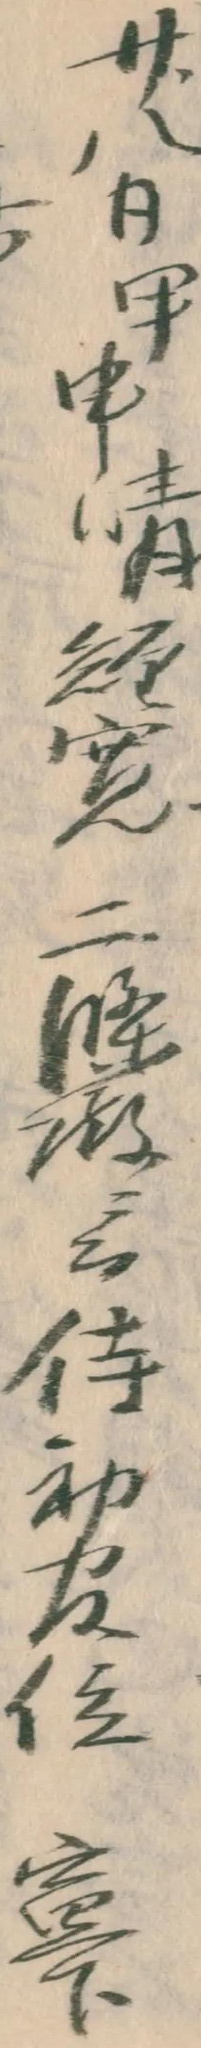廿八日甲申晴経寛二條殿ニ而侍初官位宣下
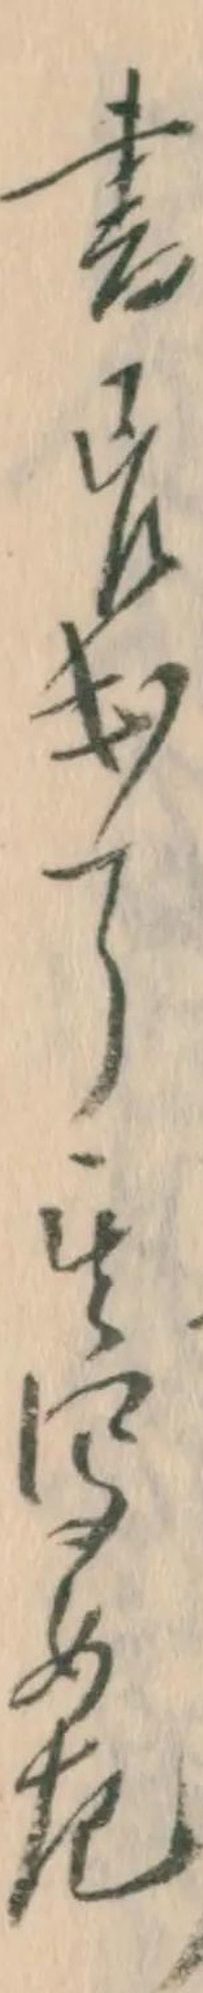書差出了其写如左
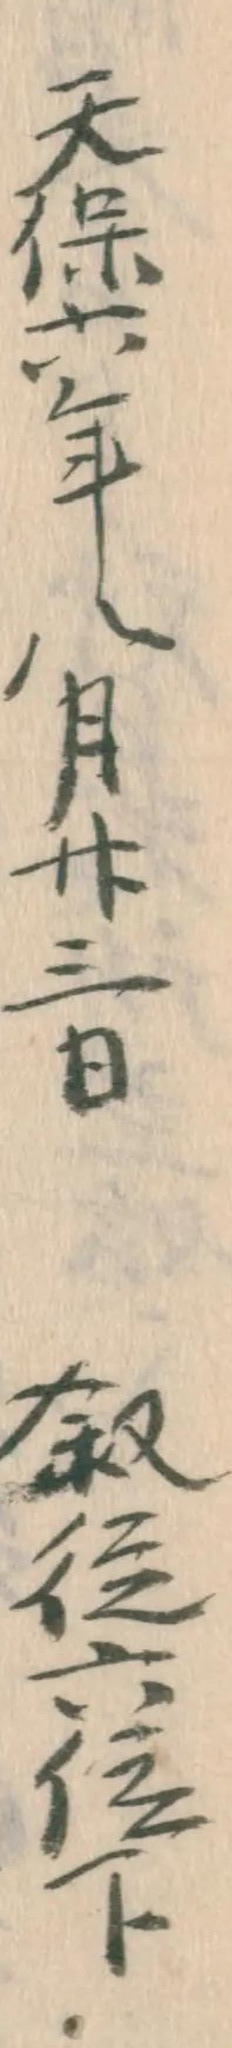天保六年八月廿三日叙従六位下
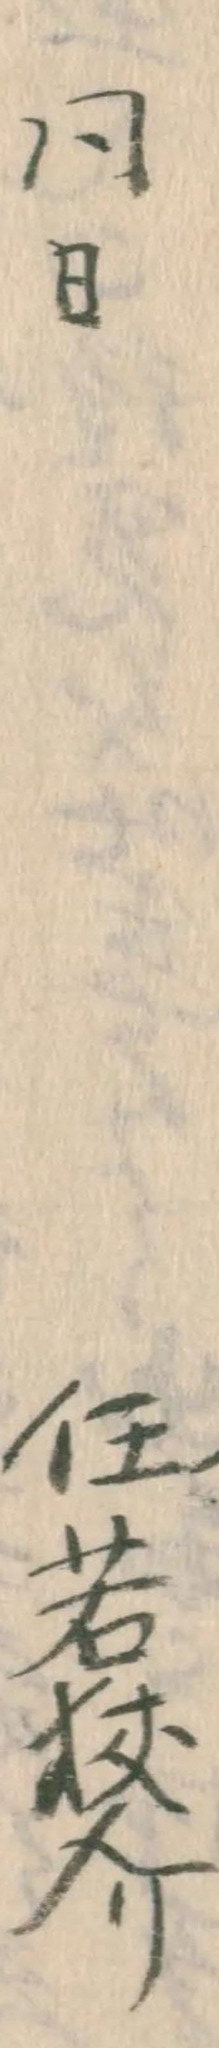同日任若狭介
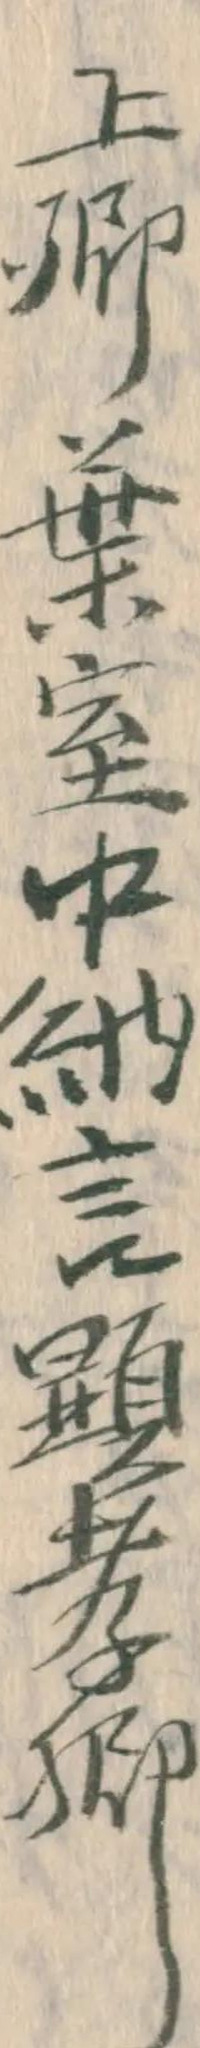上卿葉室中納言顕孝卿
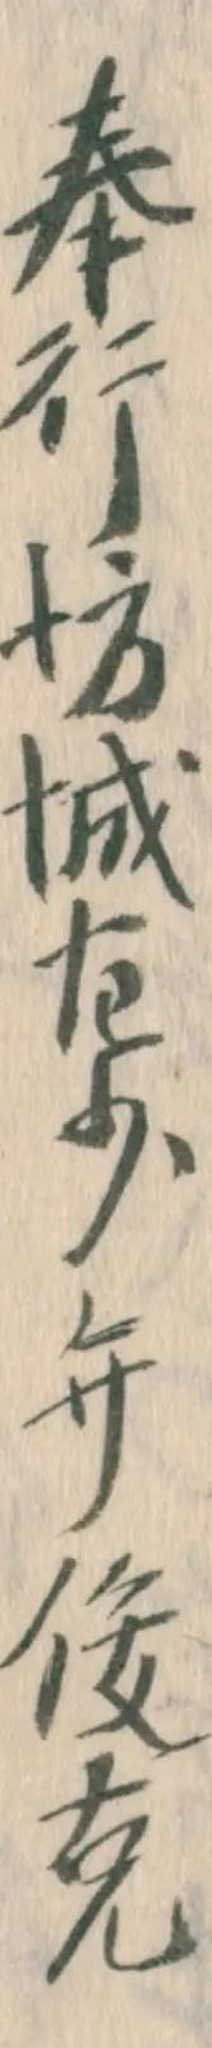奉行坊城左少弁俊克
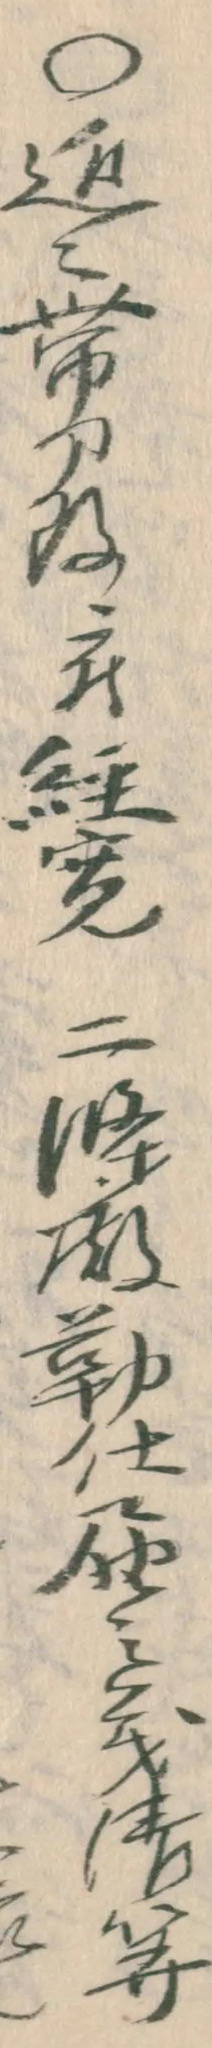○近〻帯刀致ニ付経寛二條殿勤仕届之義清算
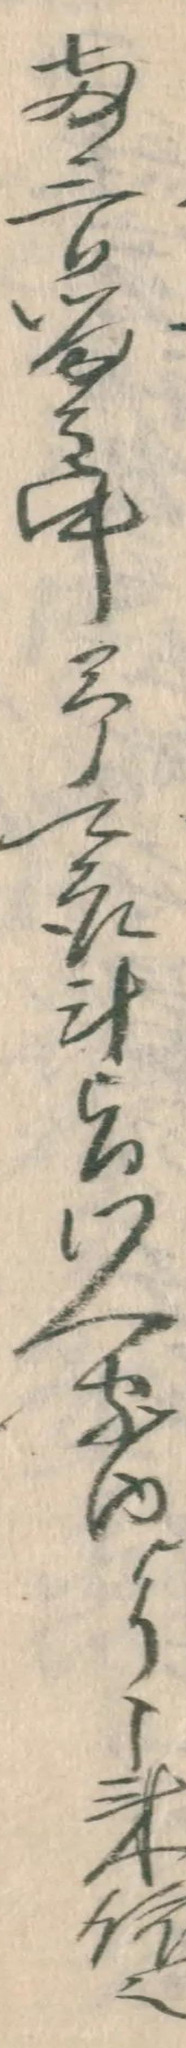両三日留主中予可取斗旨同人家内より申来依也
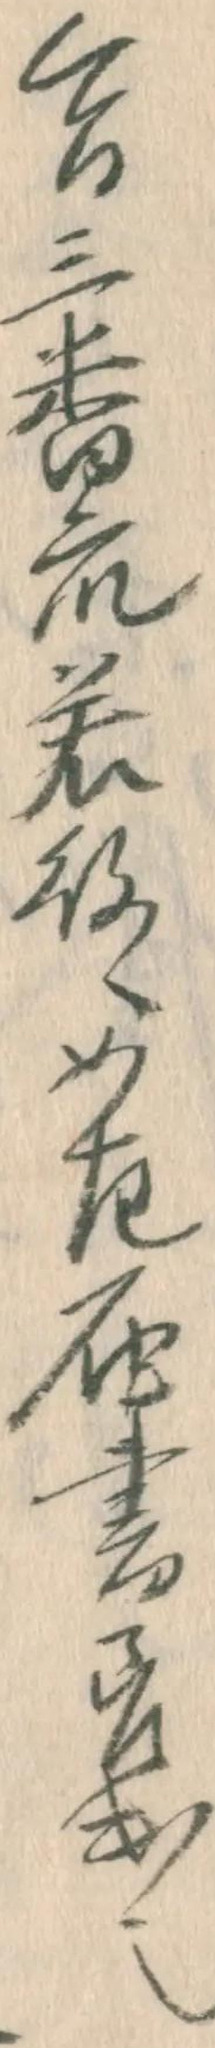今日三番衆若役へ如左届書差出也
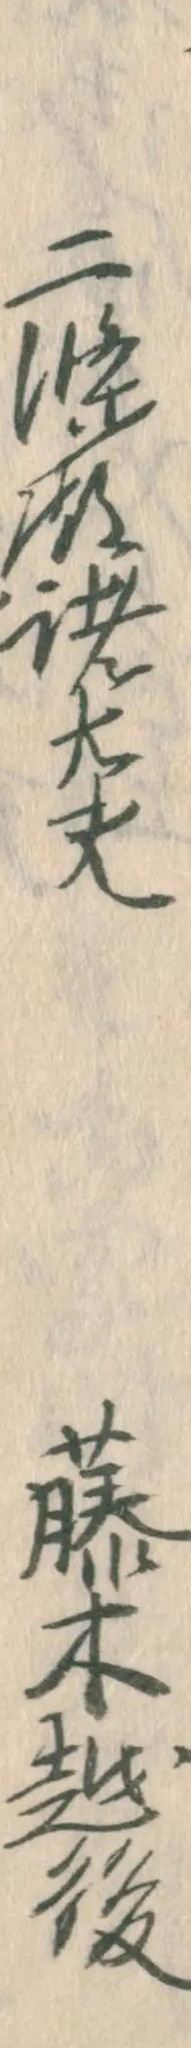二條殿諸大夫藤木越後
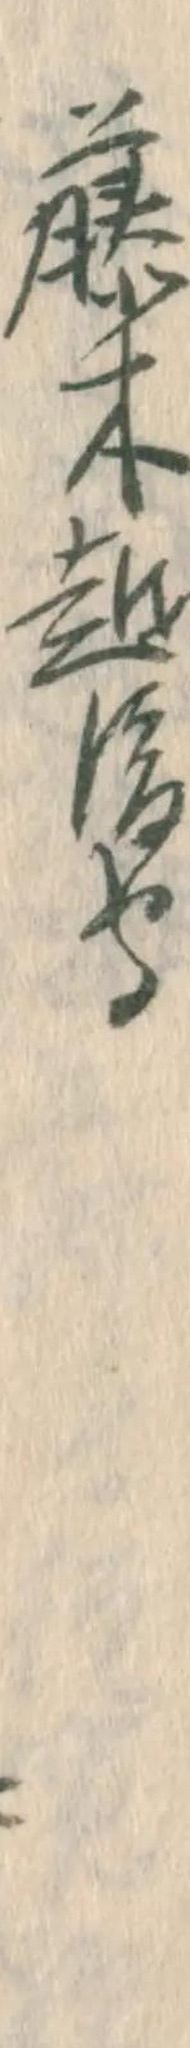藤木越後守
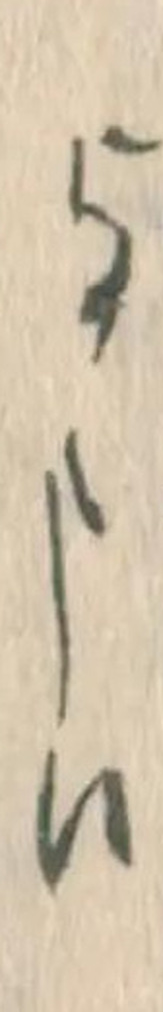と申候
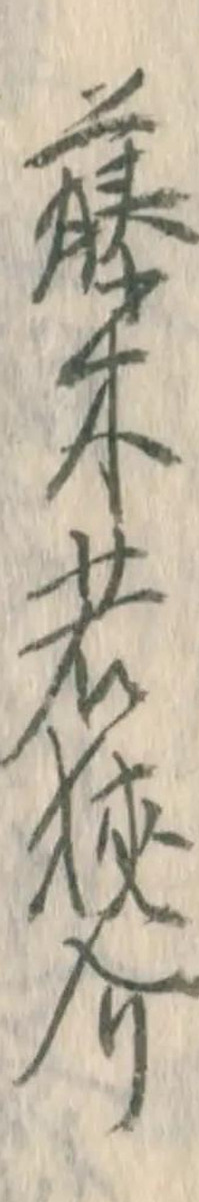藤木若狭介
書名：賀茂社記録. 第67冊
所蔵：国立国会図書館 National Diet Library, JAPAN
